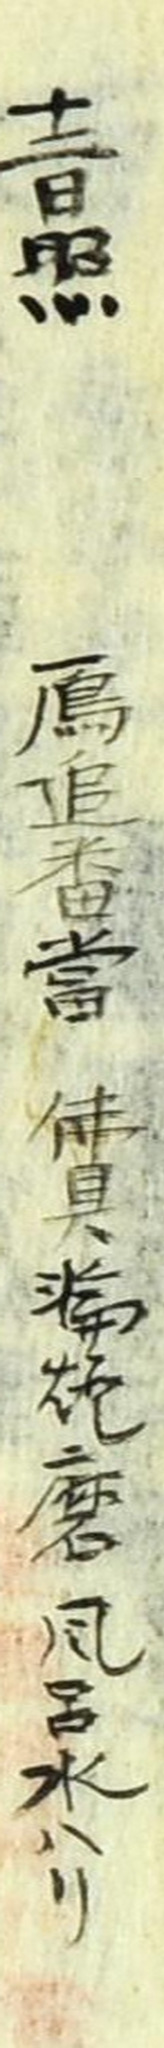十二日照雁追番当仏具輪燈磨風呂水ハリ
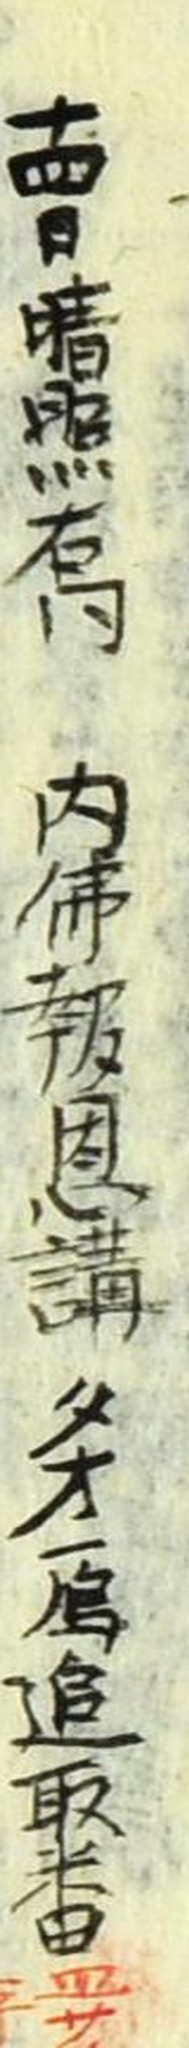十四日晴照右同内仏報恩講夕方雁追取番
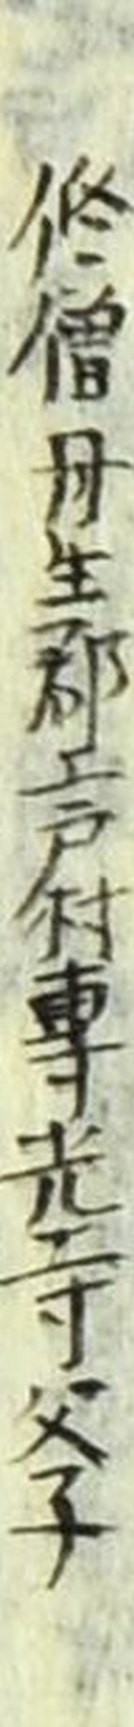修僧丹生郡上戸村専光寺父子
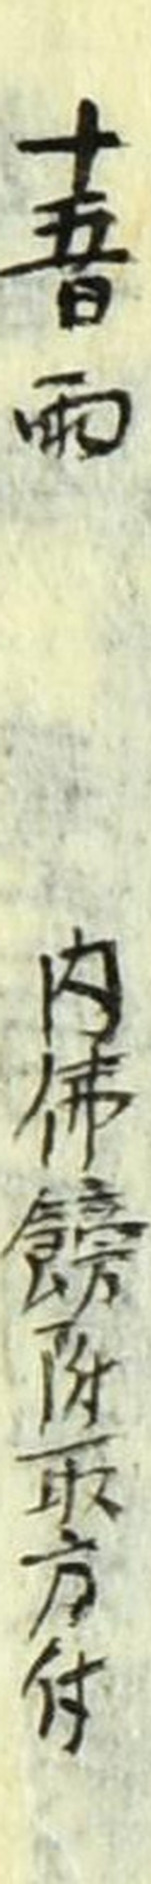十五日雨内仏飾附取方付

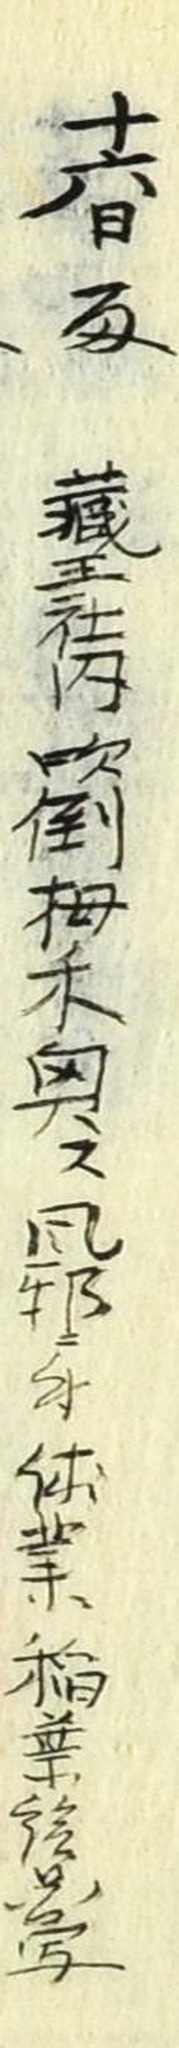十六日雨蔵王社内吹倒栂ノ木興ス風邪ニ付休業稲葉絵図写
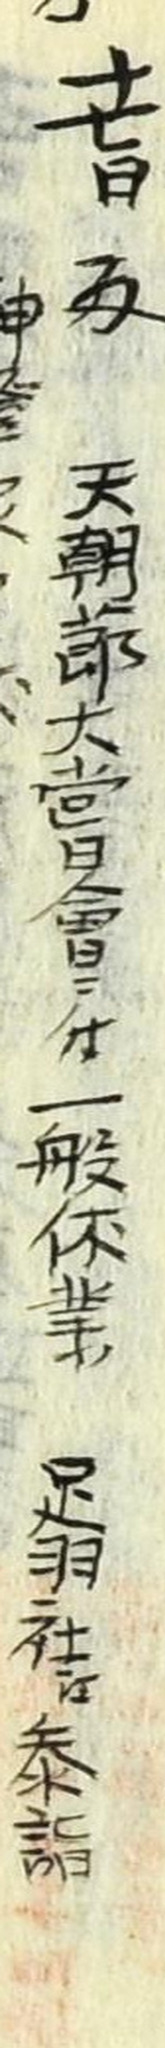○十七日雨天朝節大嘗会ニ付一般休業足羽社江参詣
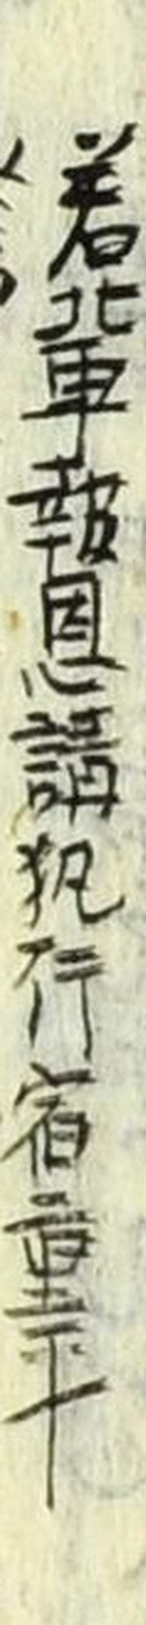若輩報恩講執行宿重平
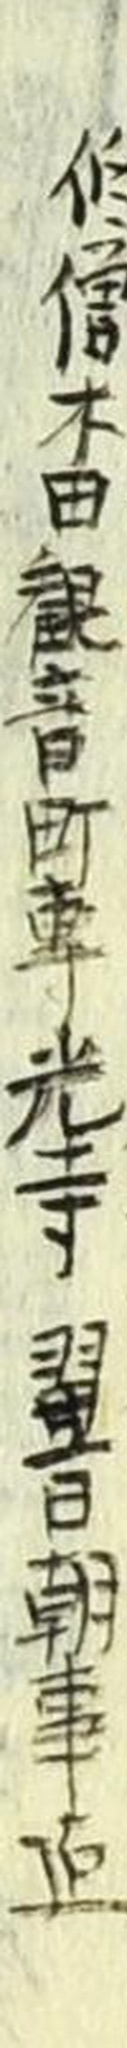修僧木田観音町専光寺翌日朝事迄
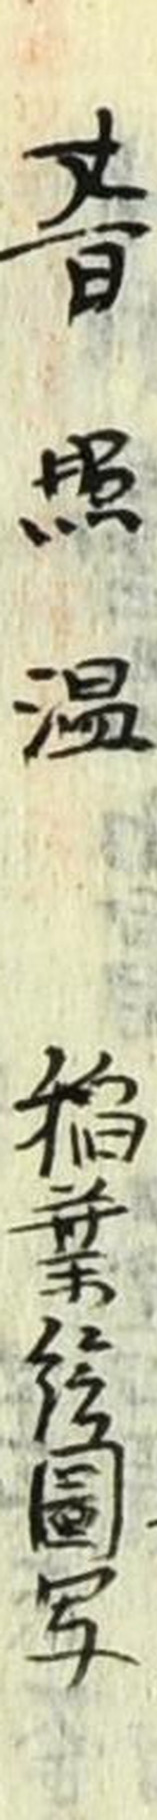廿一日照温稲葉絵図写
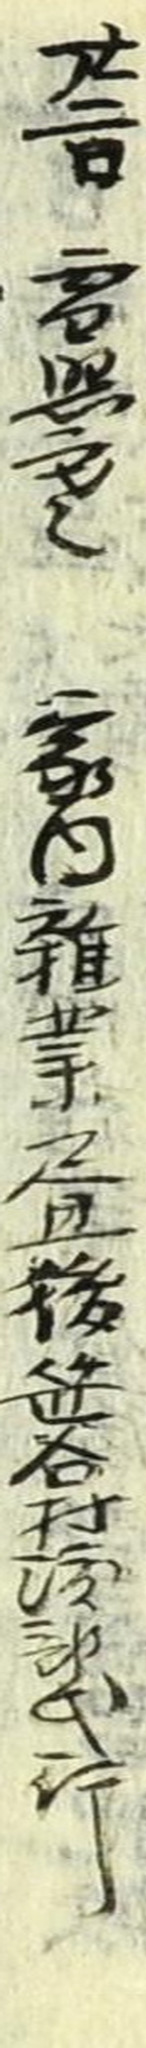廿二日雪照寒家内雑業昼後笹谷村渡部氏行
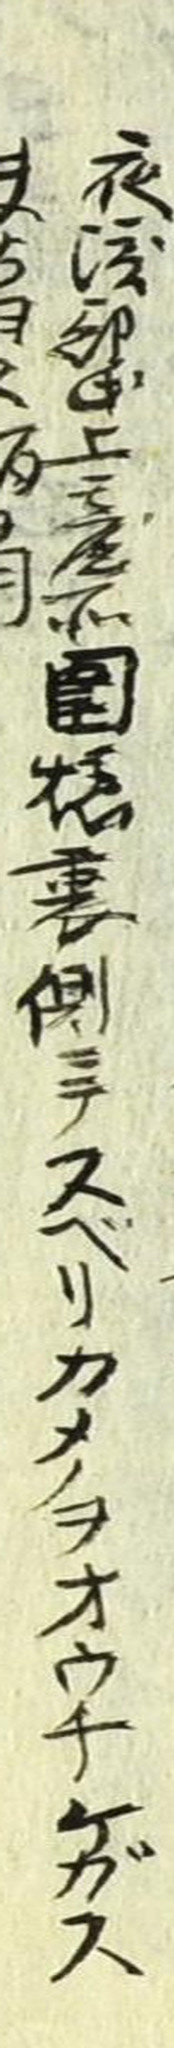夜渡部氏上台所囲炉裏側ニテスベリカメノヲウチケガス
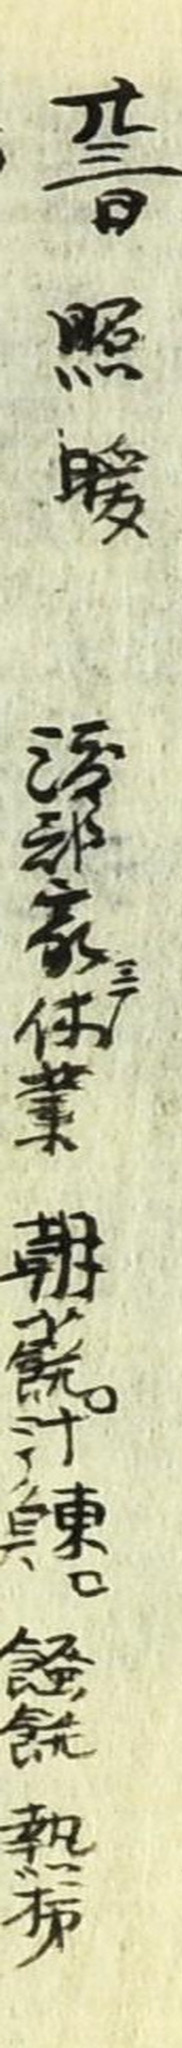廿三日照暖渡部家ニテ休業朝餅。汁鯟。餅熱柿
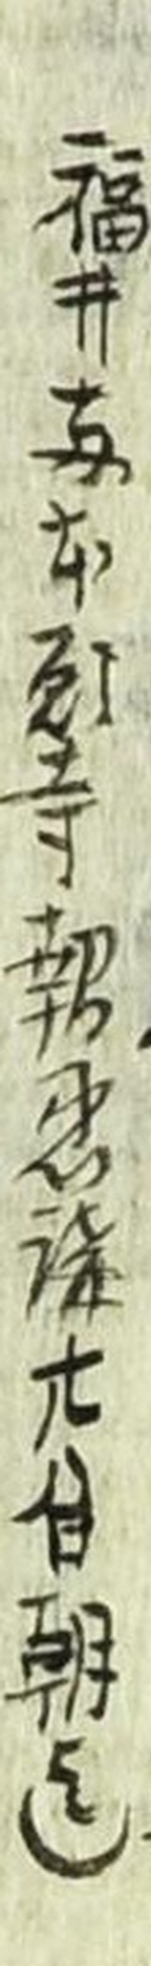福井両本願寺報恩講廿八日朝迄
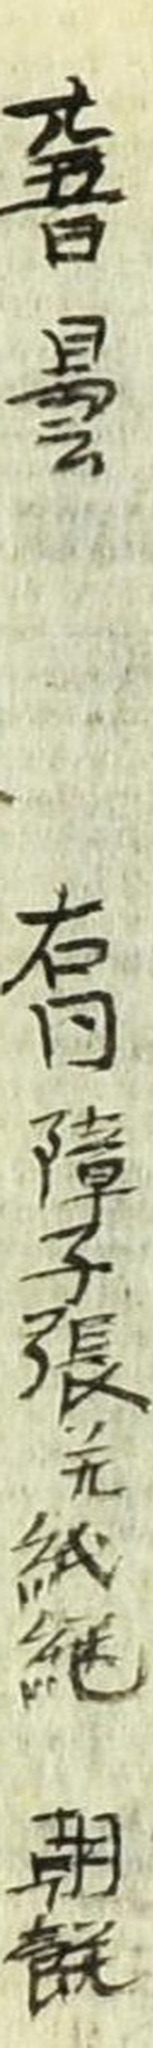廿五日曇右同障子張幷紙継朝餅
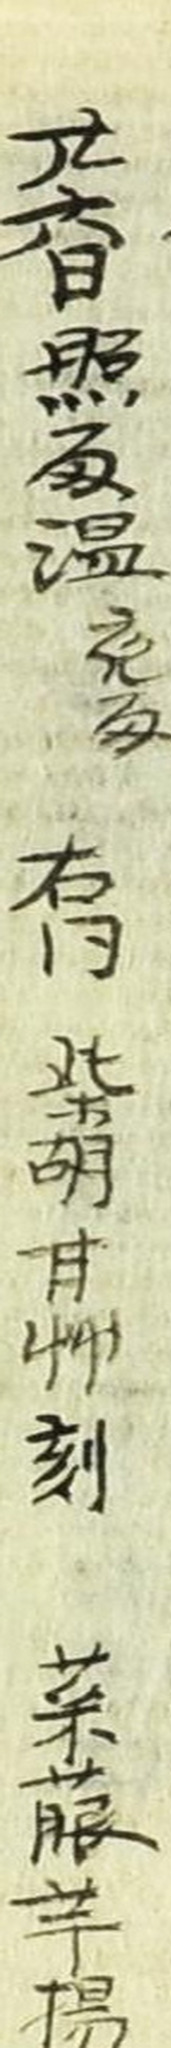廿六日照雨温夜雨右同柴胡甘艸刻菜菔芋揚
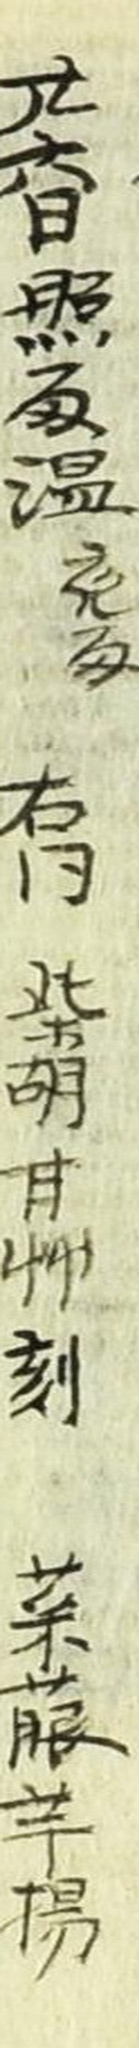廿六日照雨温夜雨右同柴胡甘艸刻菜菔芋揚
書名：（日記）
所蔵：福井県文書館 Fukui Prefectural Archives
